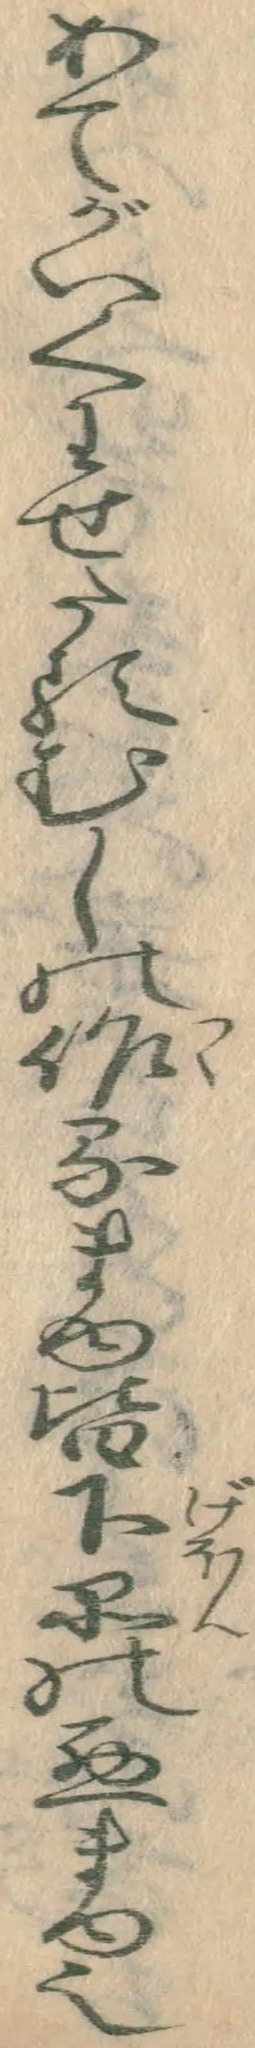あてがいくわせたるむしの作るまゆ皆下品の悪まゆ也
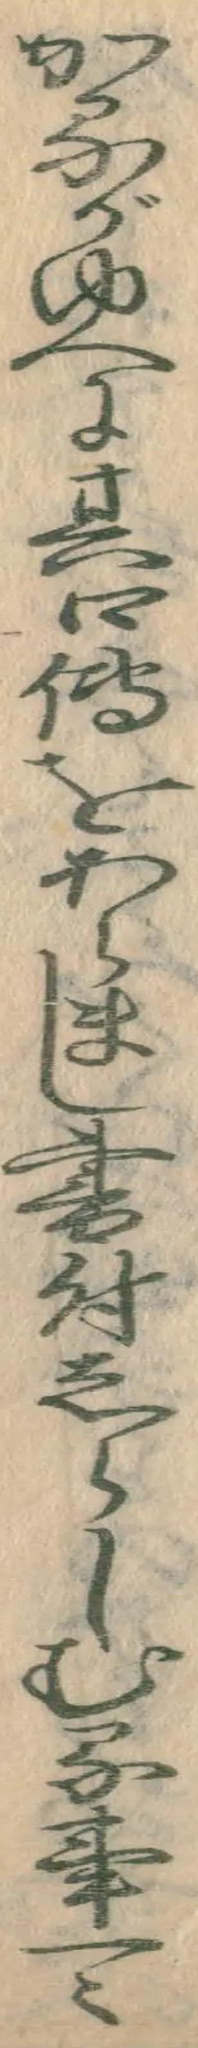かるがゆへに其口伝をあらまし書付しらしむる事一々
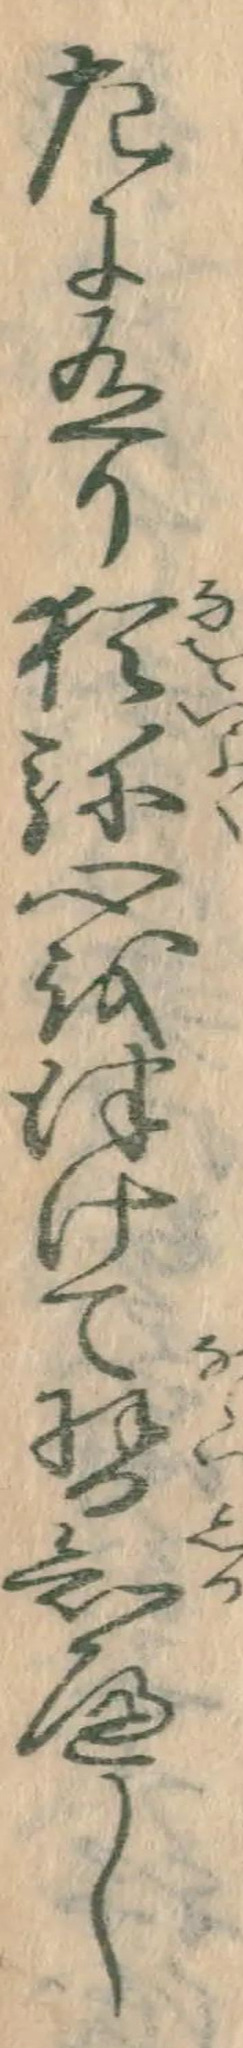左に有り猶弥心をつけて習知へし

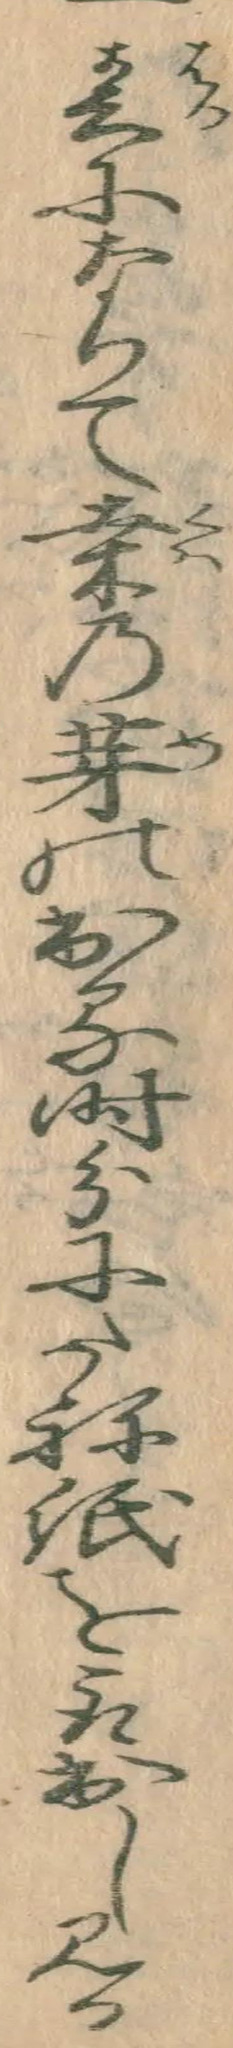一春になりて桑の芽の出る時分にたね紙を取出し見る
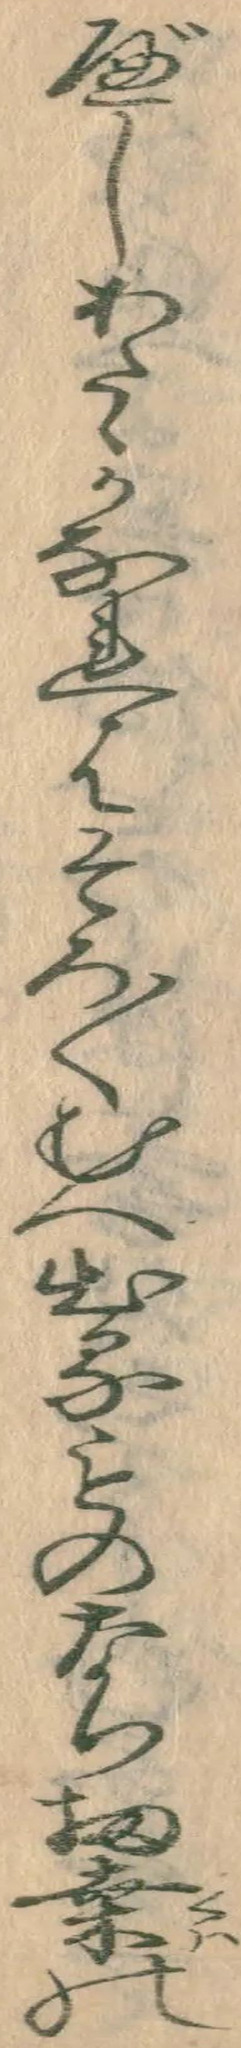べしあたゝかなれはそろ〳〵むへ出るものなり扨桑の
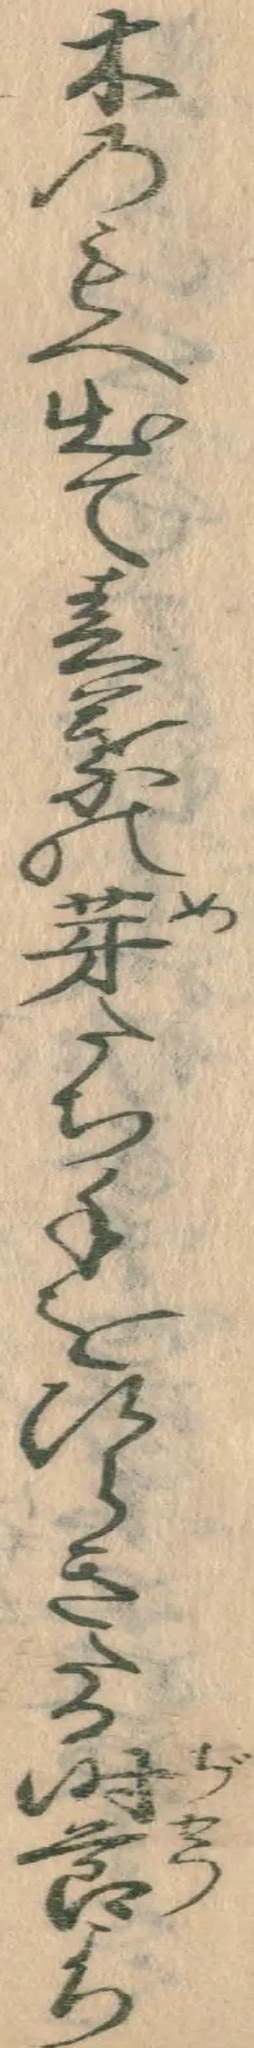木のもへ出て春葉の芽たち手をひらきたる時節より
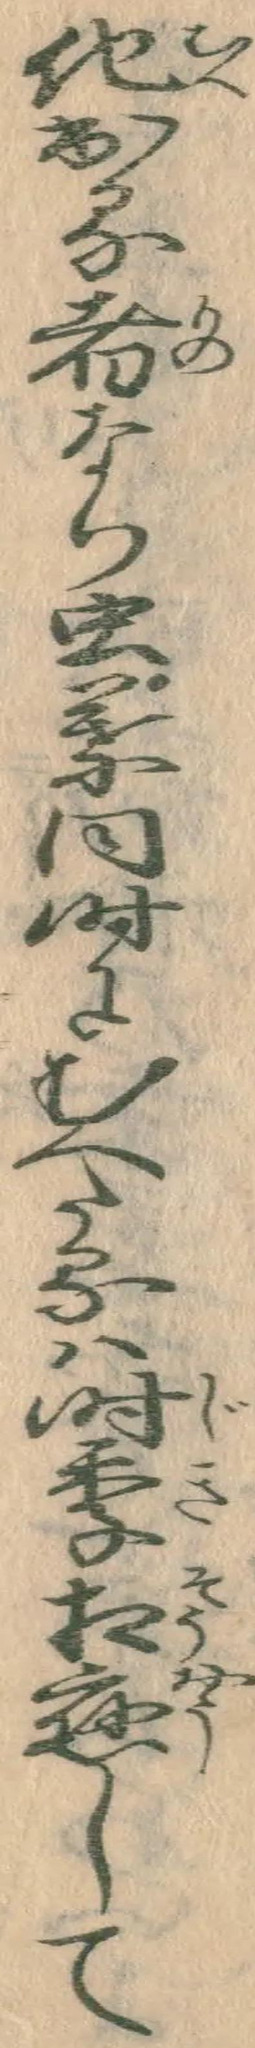化出る者なり虫。葉同時にむへたるは時季相応して
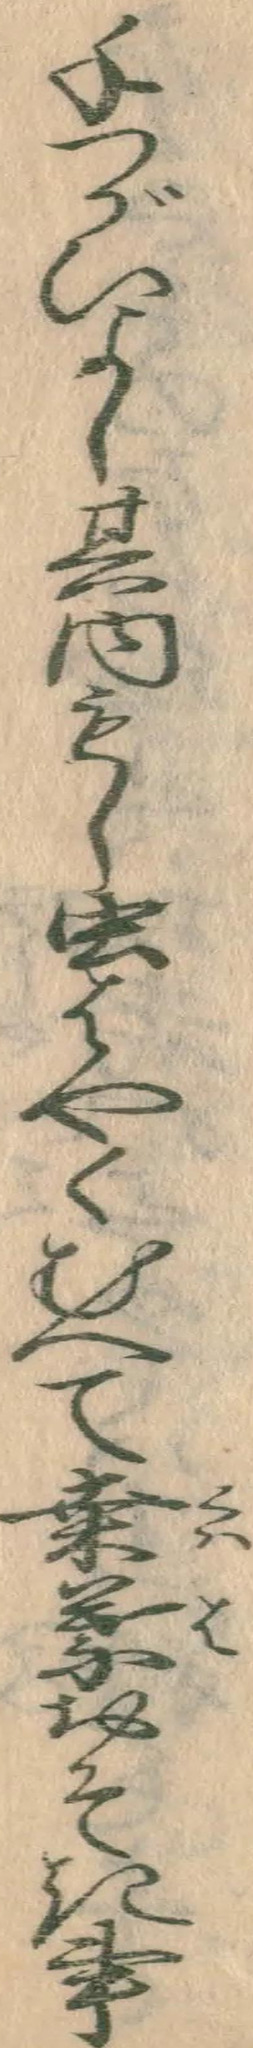手つがひよし其内もし虫はやくむへて桑葉おそき事
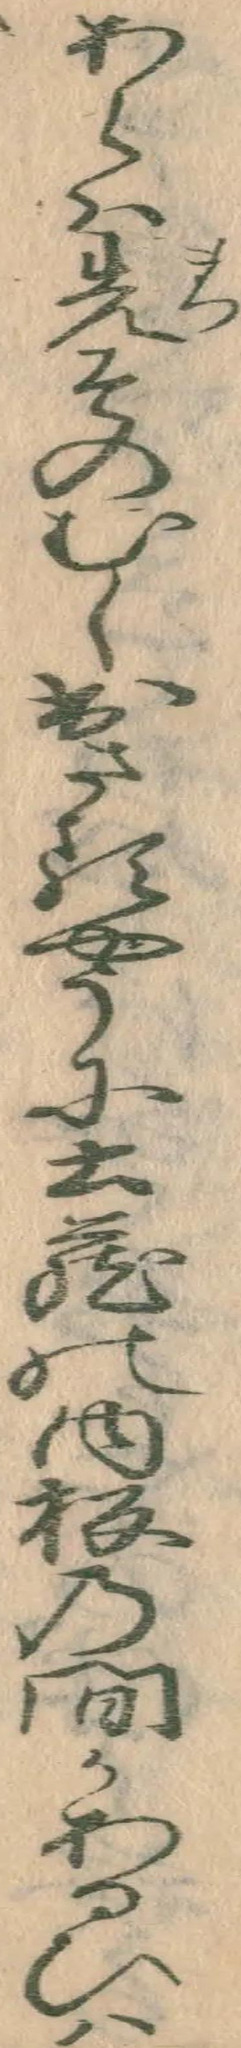あらは先そのむし出さるやうに土蔵の内板の間かあるひは
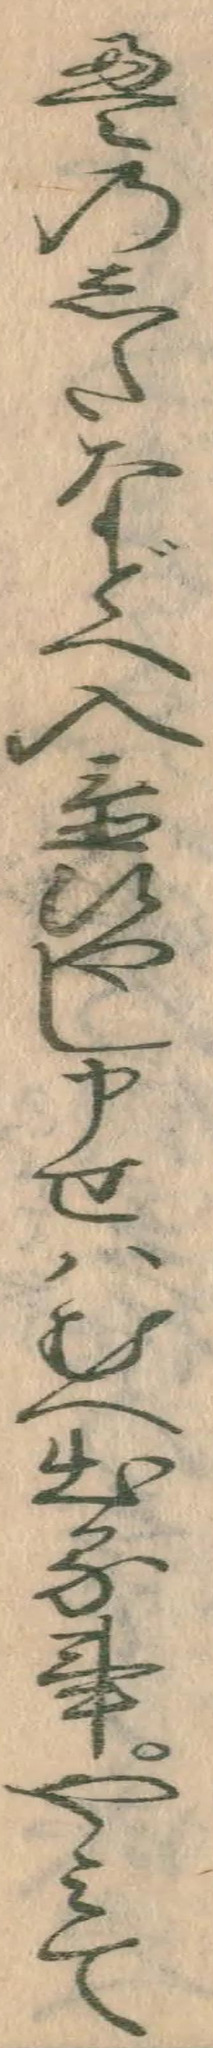畳のしたなどへ入置ひやし申せはむへ出る事。やみて
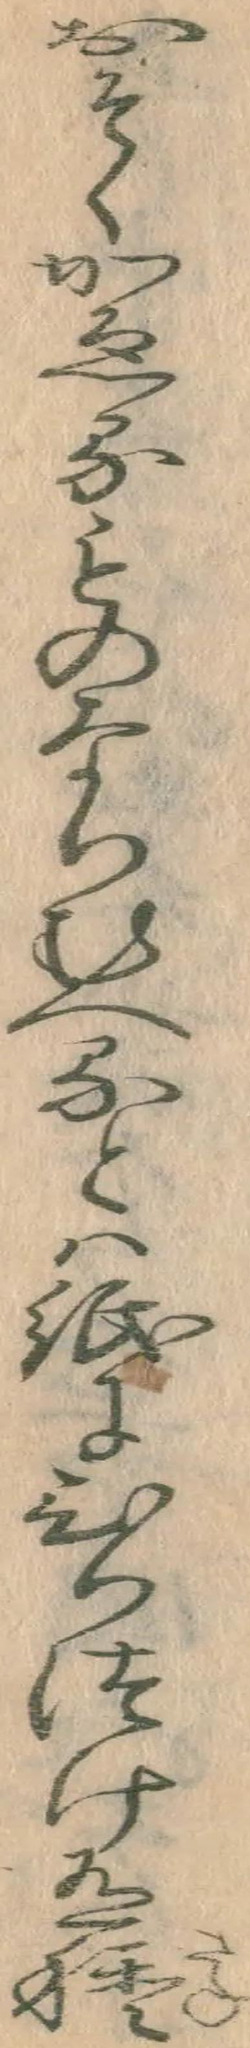おそくかゑるものなりむへるとは紙にひりつけ有種
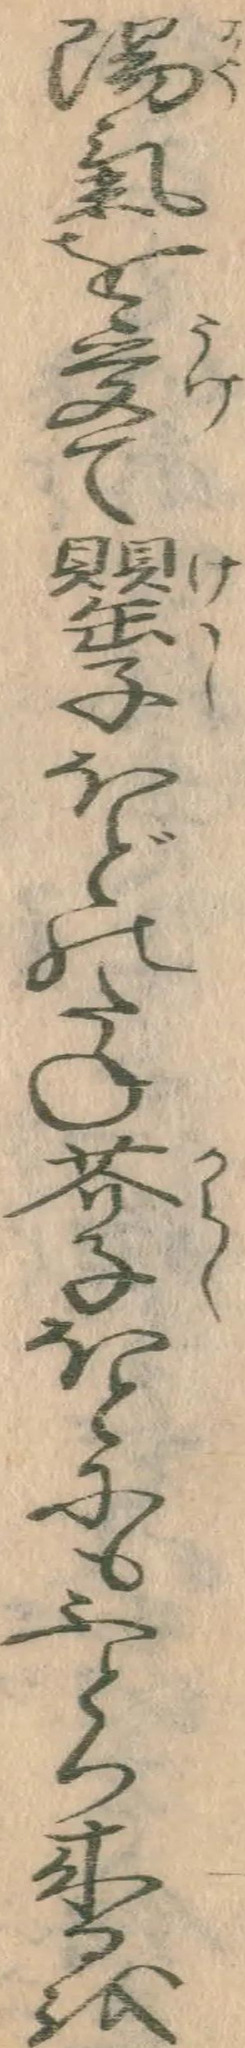陽気を受て罌子ほどのたね芥子ほとにもふとり来るを
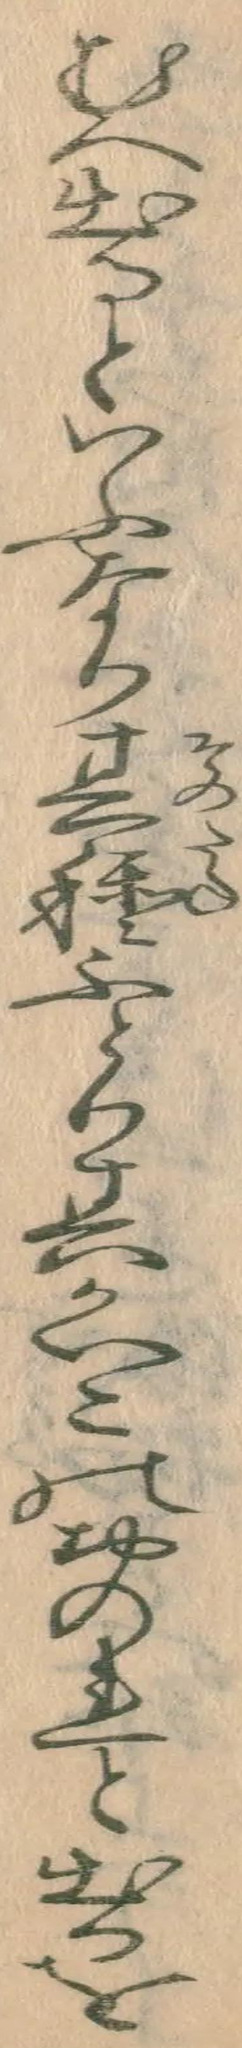むへ出るといふなり其種ふとり其かいこのおのれと出るを
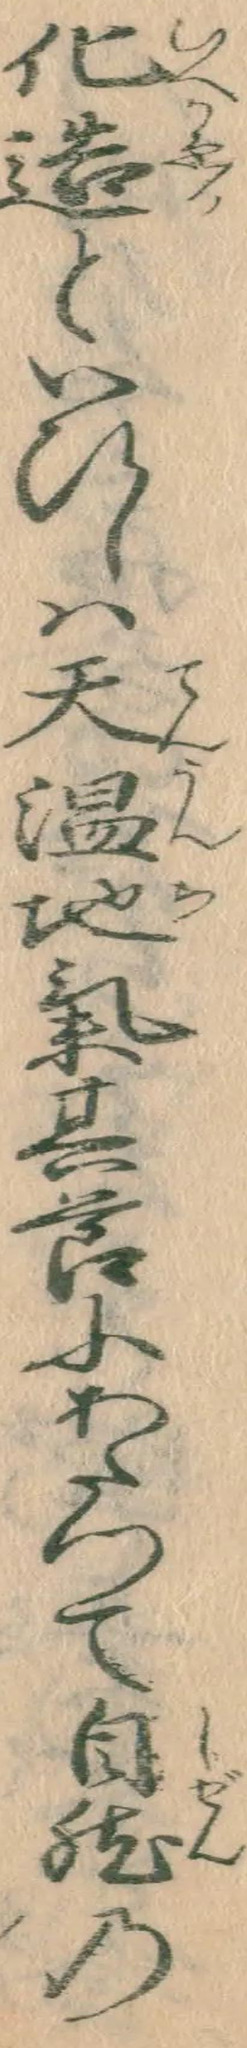化造といひしは天温地気其節にあたつて自然の
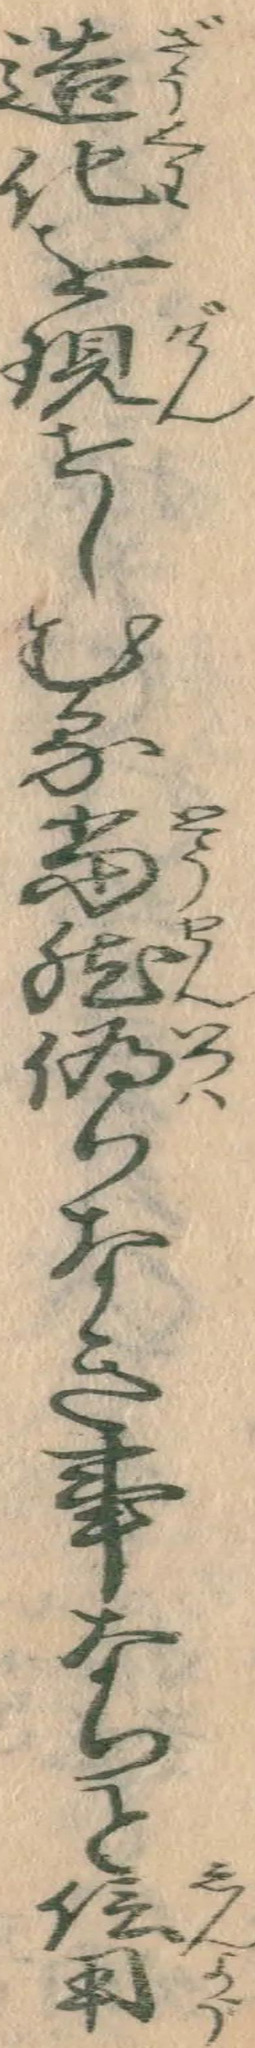造化を現せしむる当然偽りなき事なりと信用
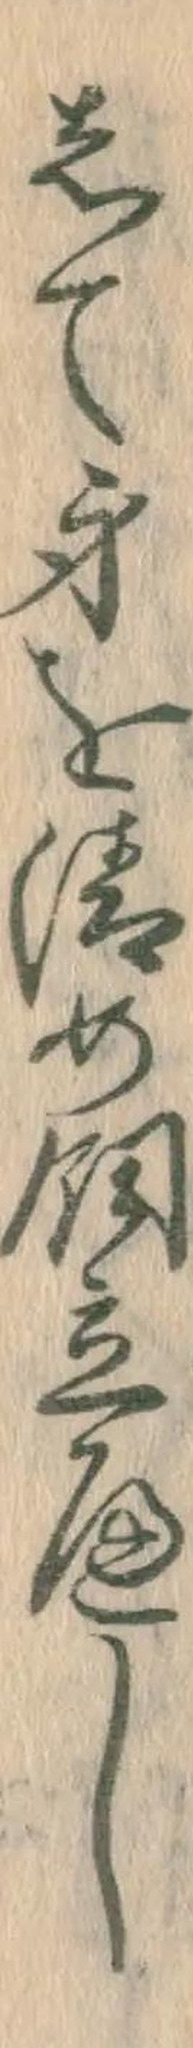して身を清め飼立へし
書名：蚕飼養法記
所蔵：国立国会図書館 National Diet Library, JAPAN
